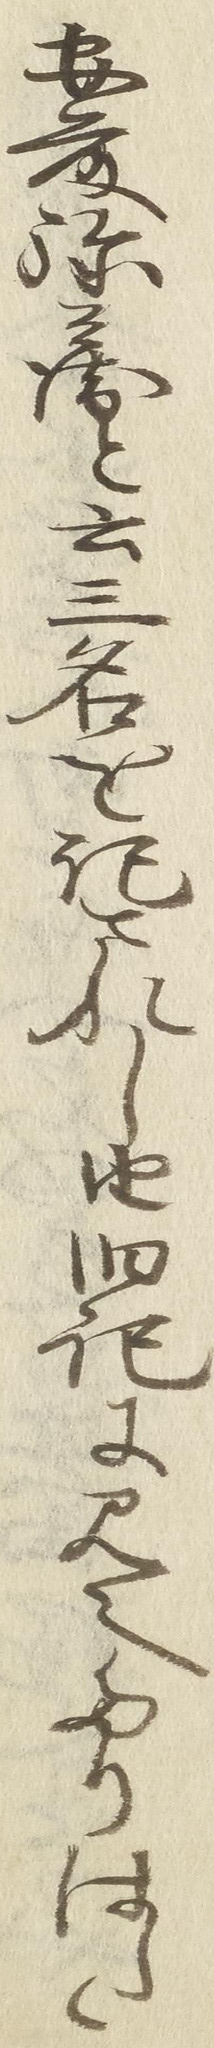安藤弥兵衛と云三名を記されし由旧記に見へたりはた
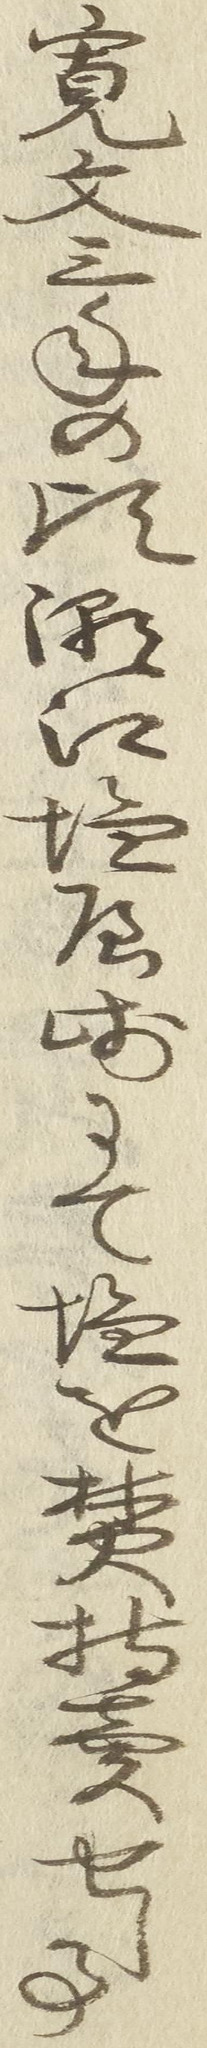寛文三年の頃潮江塩屋崎にて塩を焚持売せし事

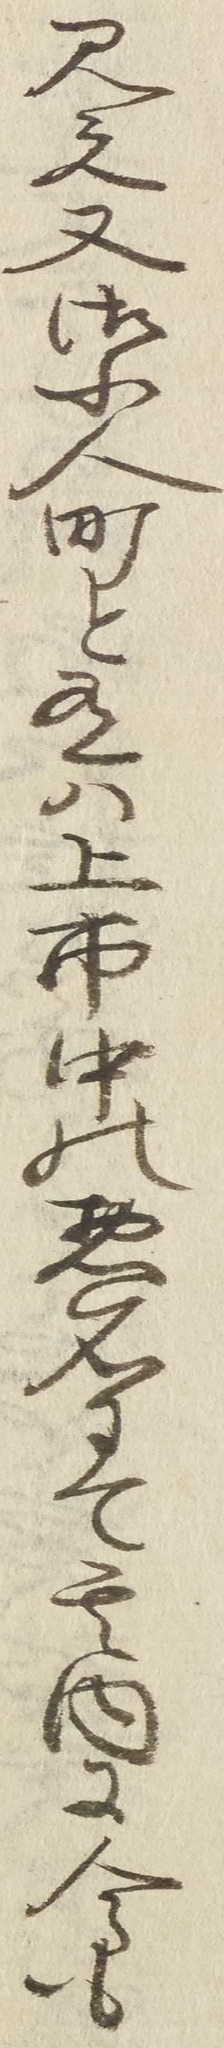見え又御小人町と有は上市中の惣名にて其内に今も
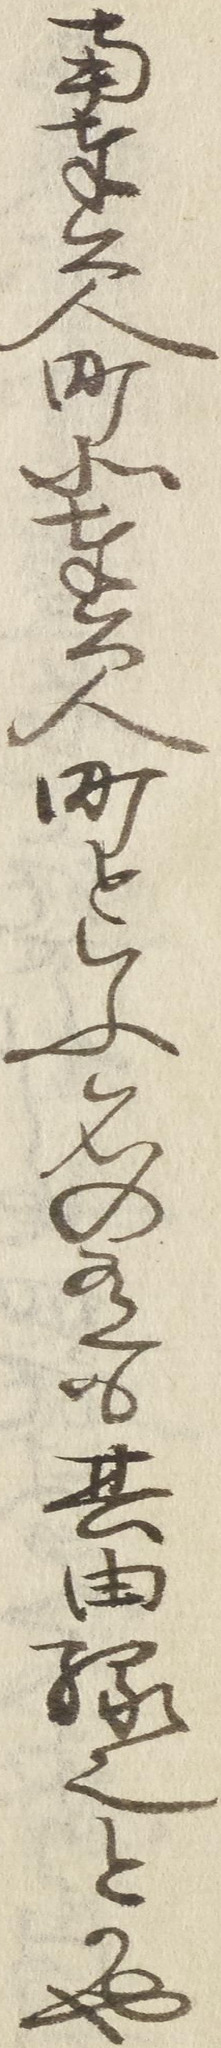南奉公人町北奉公人町といふ名の有も其由縁也とかや
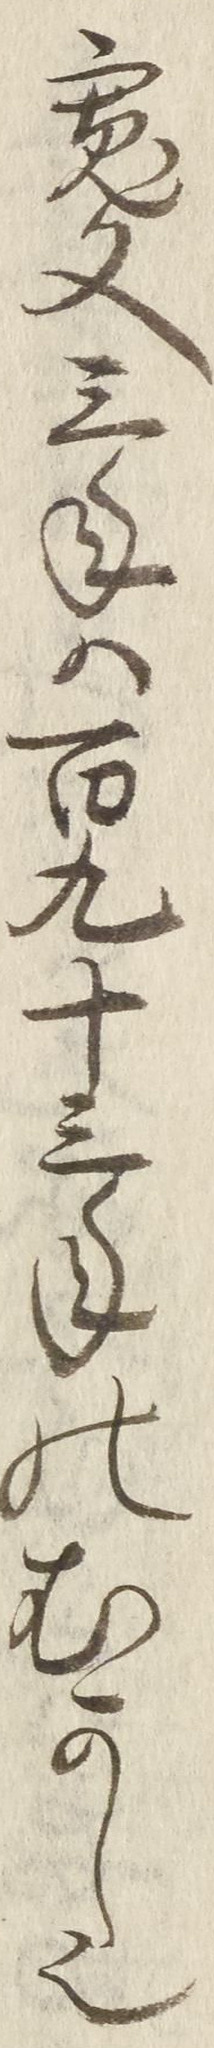寛文三年は百九十三年のむかし也
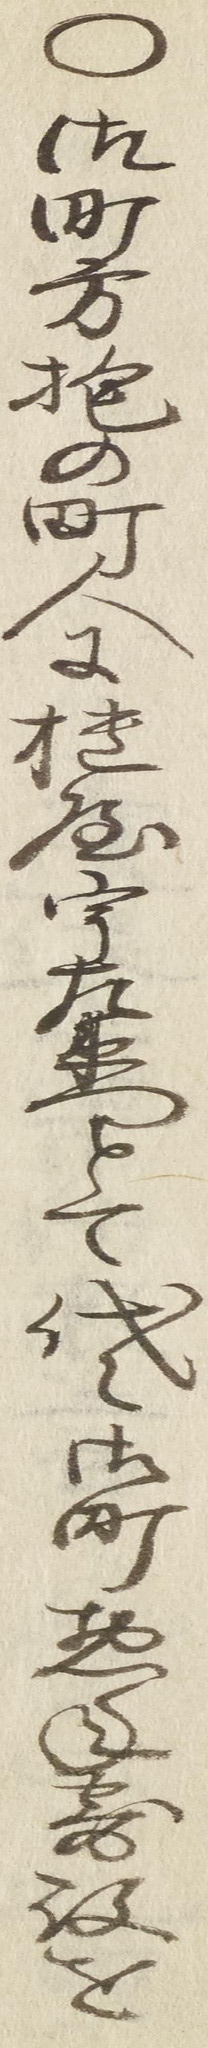〇御町方抱の町人に櫃屋宇左衛門とて代々御町惣年寄役を
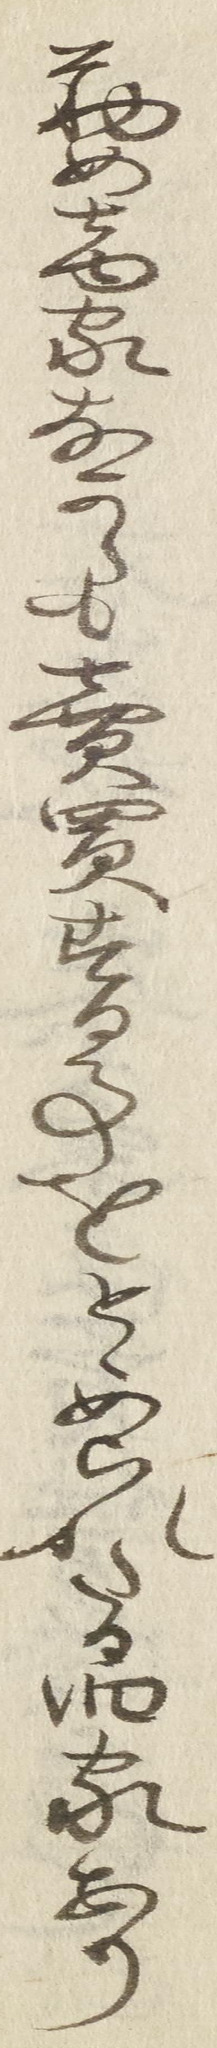勤め商家なからも売買する事をとゝめられたる旧家あり
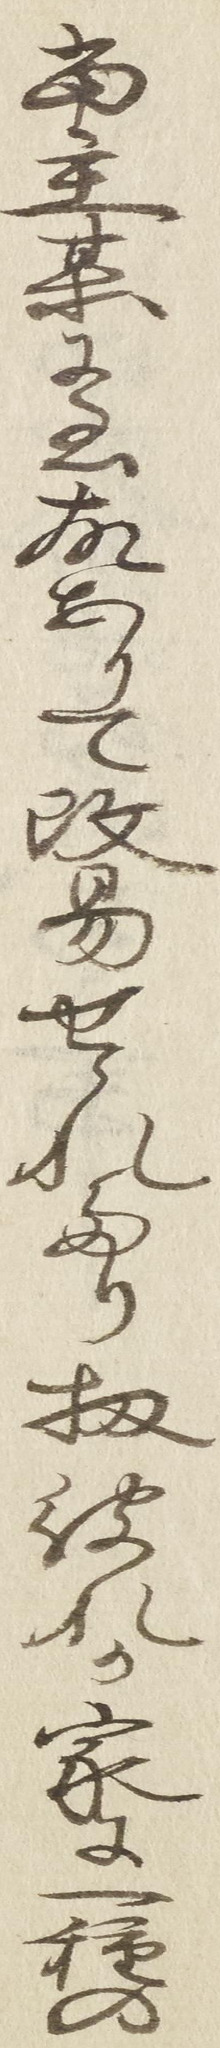当主某に至故ありて改易せられたり扨彼れの家に一種の
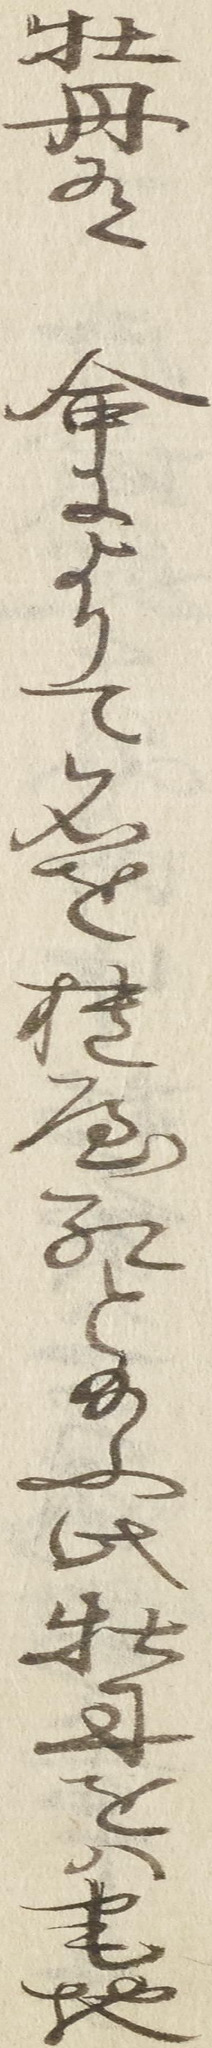牡丹有命によりて名を櫃屋紅となふ此牡丹をは宅地
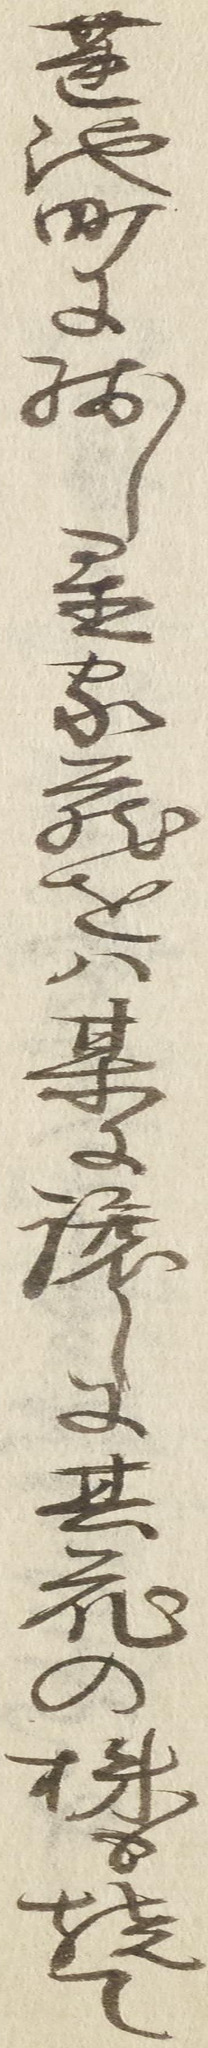蓮池町に残し置家蔵をは某に譲しに其花の株も焼て
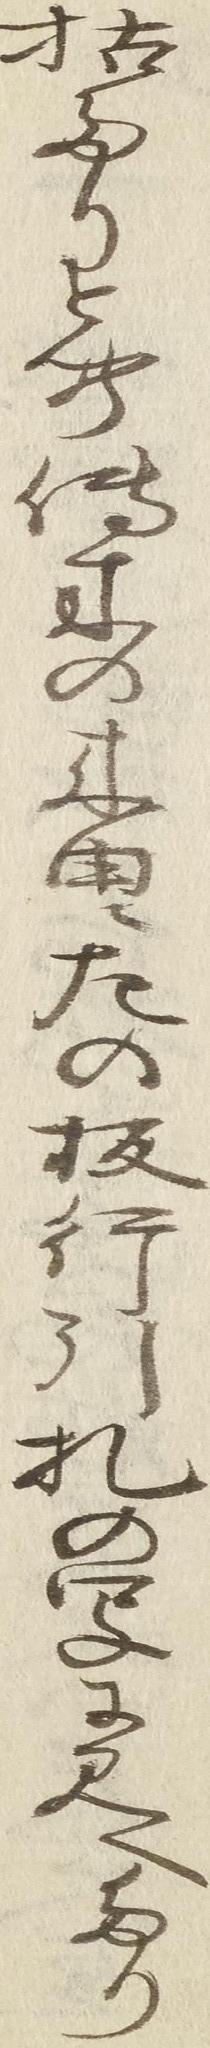枯たりと聞伝来の来由に左の板行引札の写しに見へたり
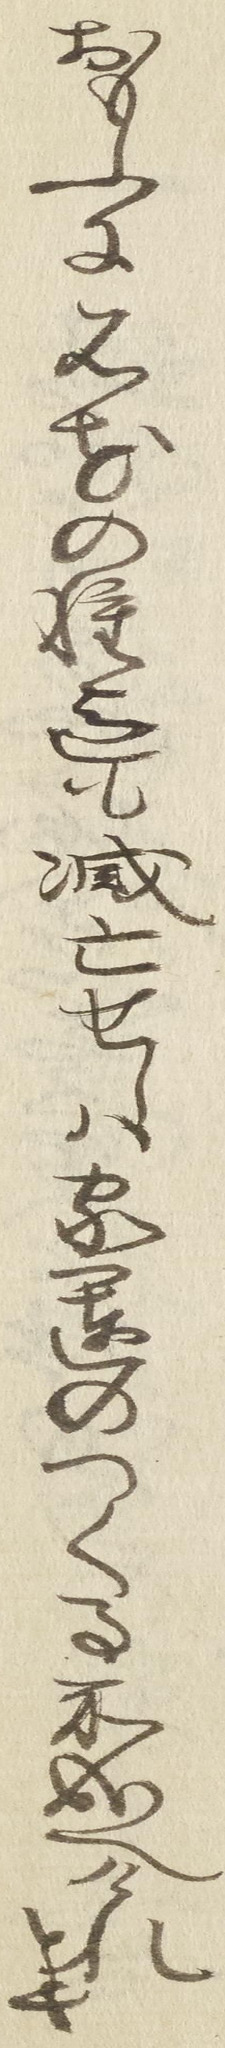おもふに右花の種迄も滅亡せしは家運のつくる所成へけれとも
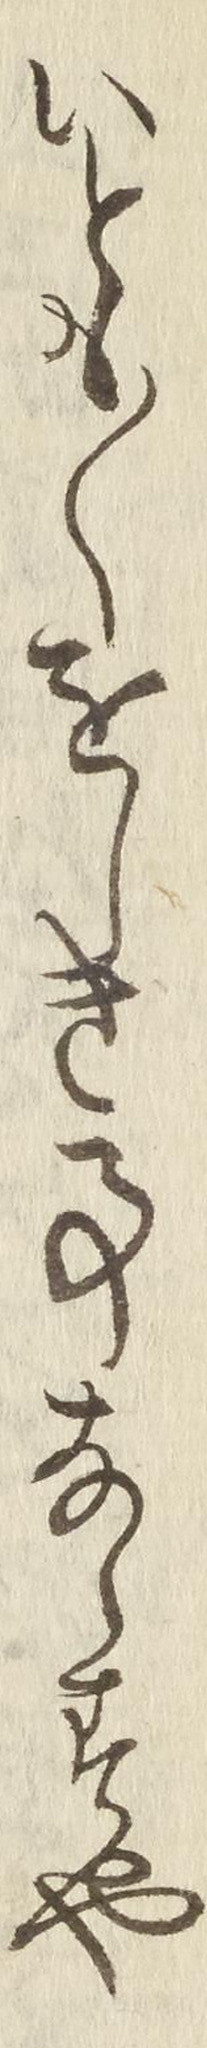いとも〳〵をしき事ならすや
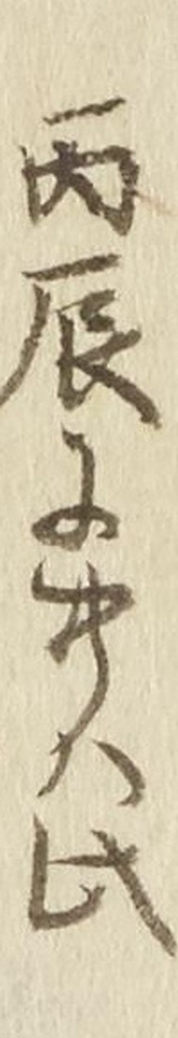丙辰に聞は此
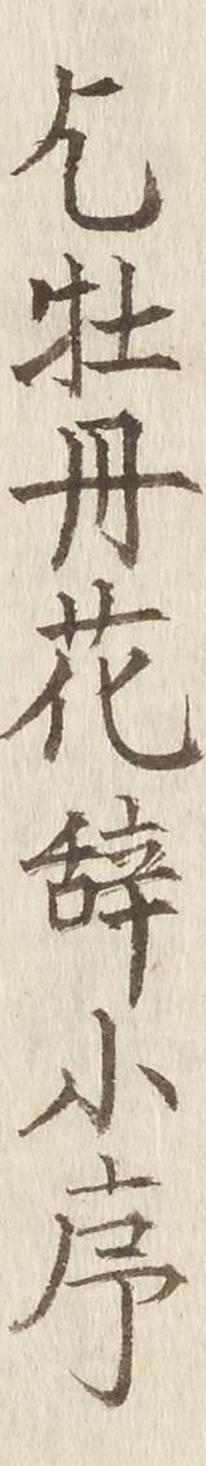乞牡丹花辞小序
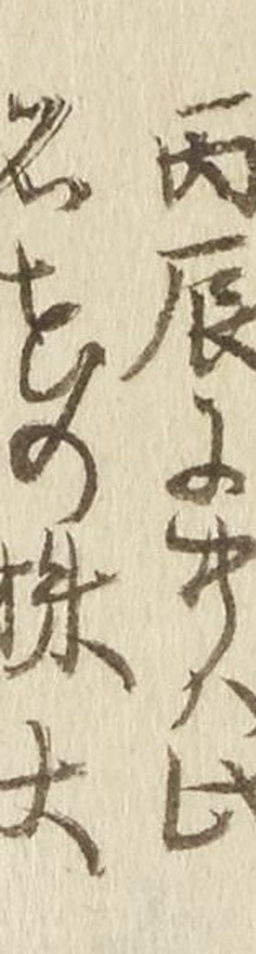名花の株大
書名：地震記　上
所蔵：東京大学地震研究所図書室 Earthquake Research Institute Library, The University of Tokyo, JAPAN
